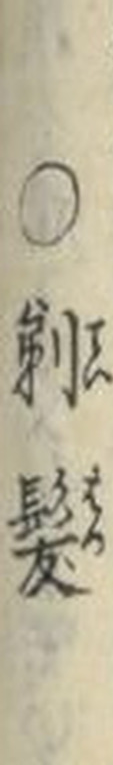○剃髪
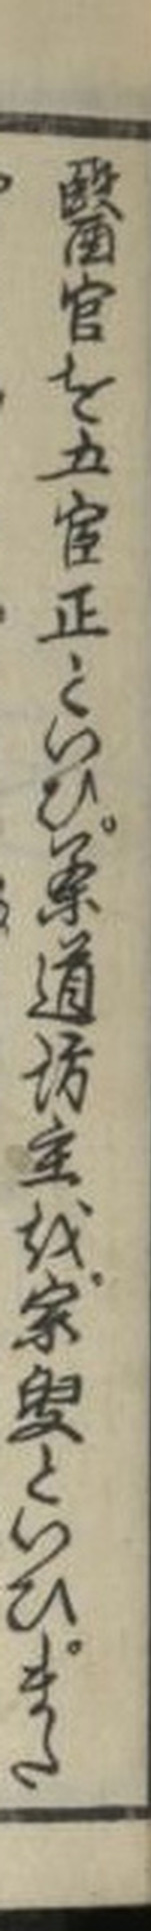医官を五宦正といひ。茶道坊主を。家叟といひ。また
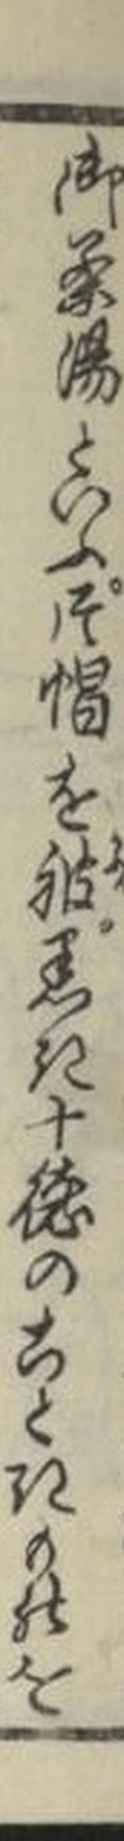御茶湯といふ。片帽を被。黒き十徳のこときものを
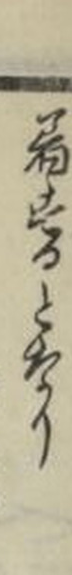着するとなり
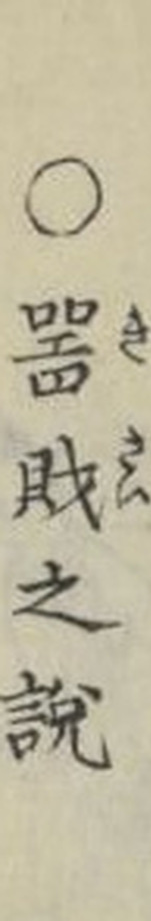○器財之説
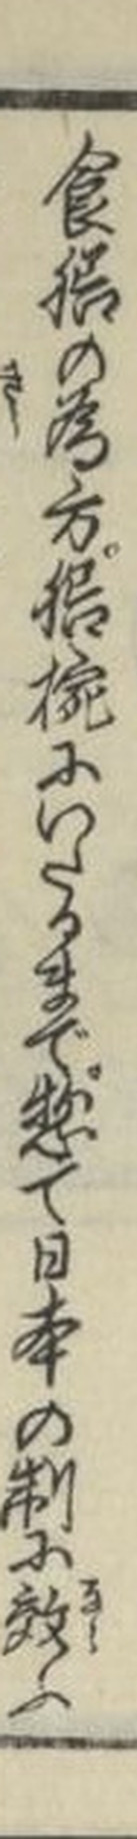食膳の為方。膳椀にいたるまで。惣て日本の制に効ふ
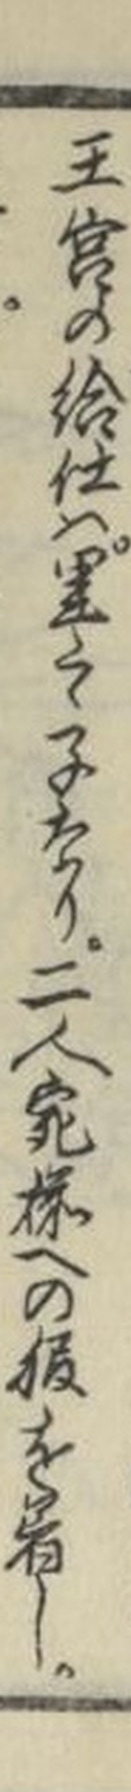王宮の給仕は。里之子なり。二人宛揃への服を着し。
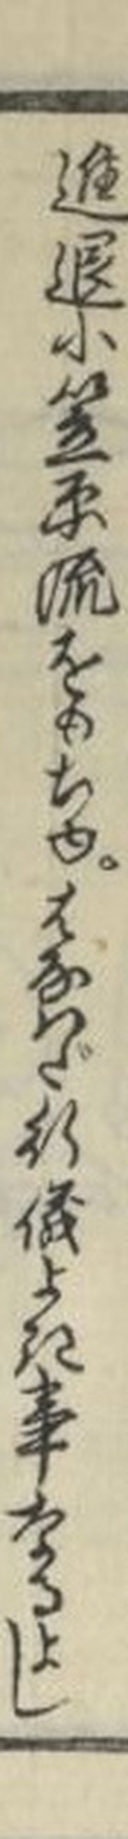進退。小笠原流をもちゆ。はなはだ行儀よき事なるよし
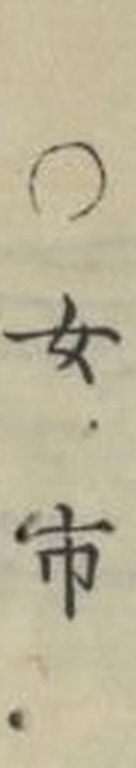○女市
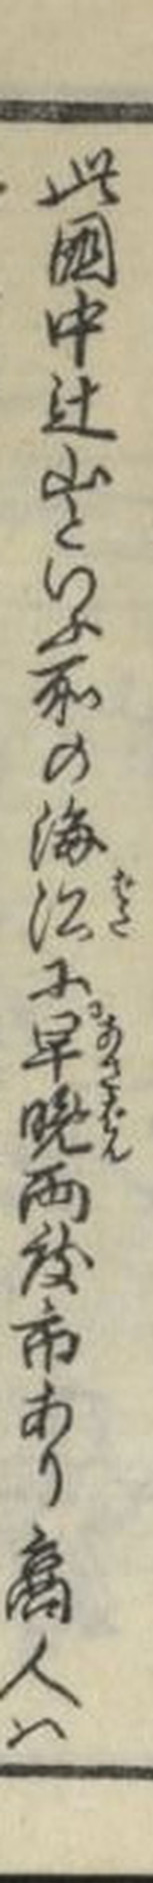此国中辻山といふ所の海沿に。早晩両度市あり商人は
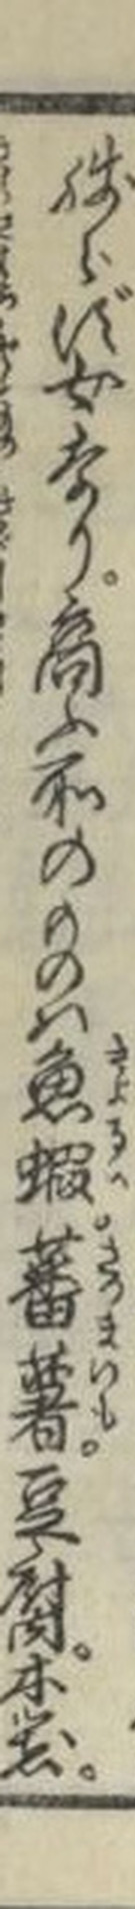残らず女なり。商ふ所のものは魚蝦。蕃薯。豆腐。木器。
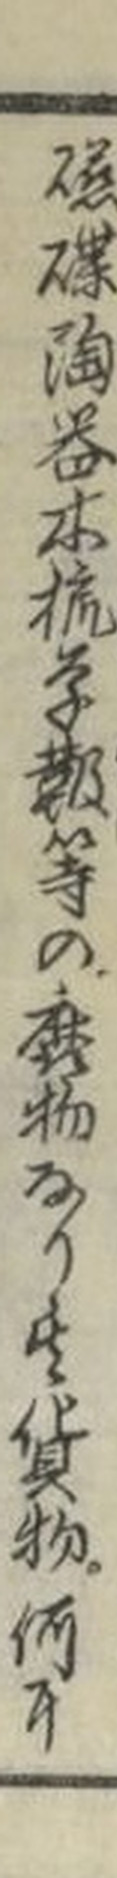磁碟。陶器。木梳草靸等の麤物なり其貨物。何に
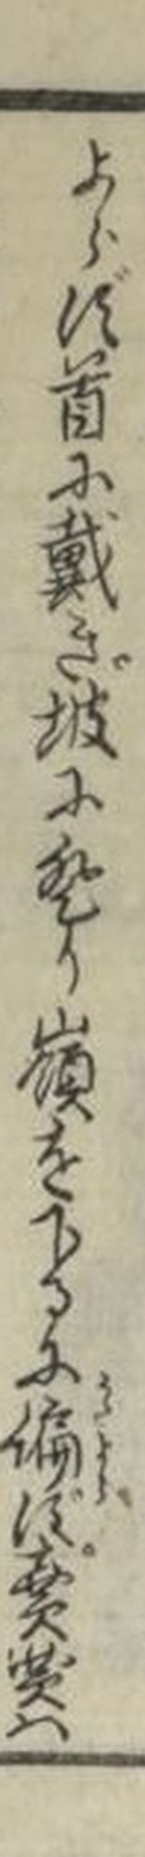よらず首に戴き。坡に登り嶺を下るに偏ず。売買は
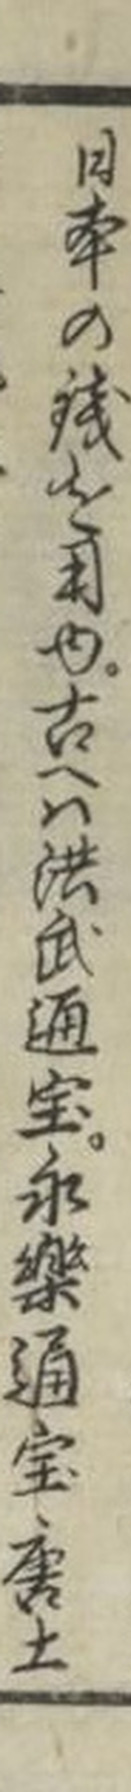日本の銭を用ゆ。古へは洪武通宝。永楽通宝唐土
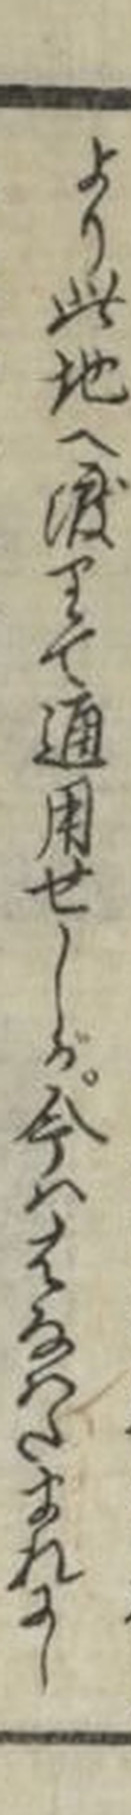より此地へ渡りて通用せしが。今ははなはたまれにし
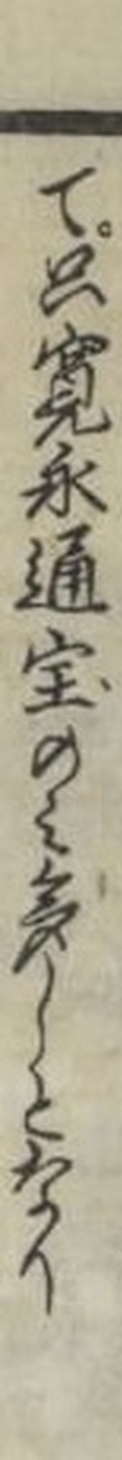て。只寛永通宝のみ多しとなり
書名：琉球解語
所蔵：University of the Ryukyus Library
